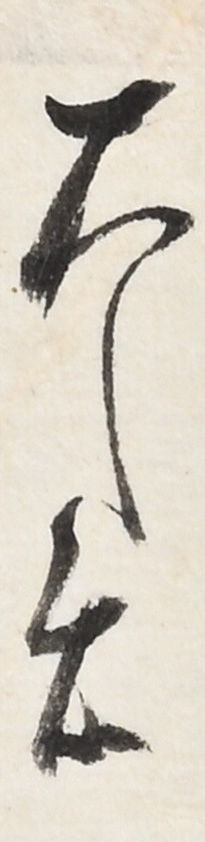右之者
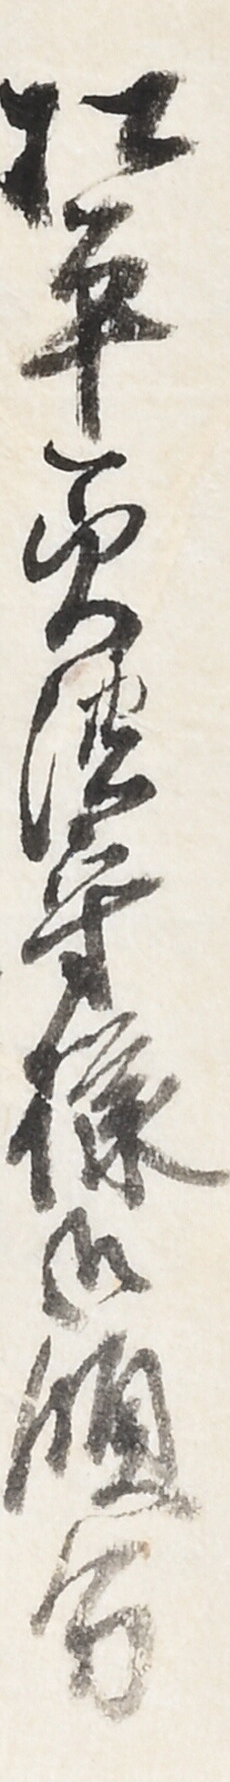松平美濃守様御領分
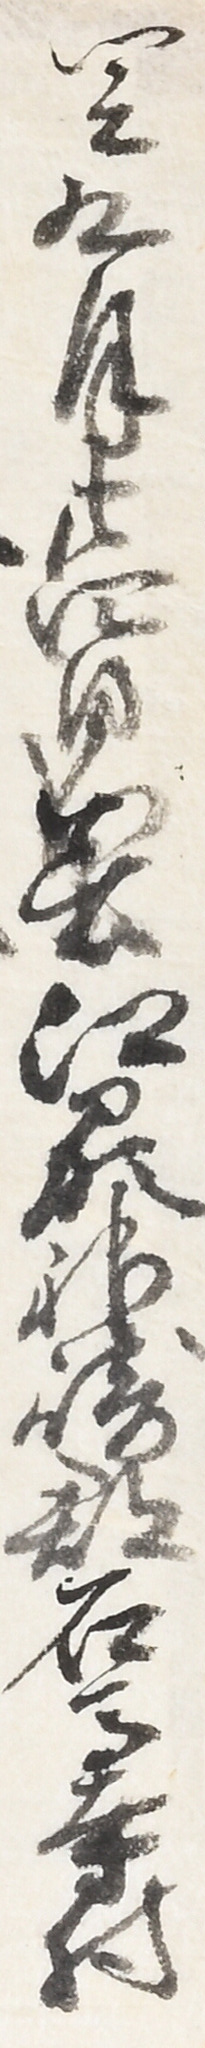閏九月廿四日着江州神崎郡石馬寺村
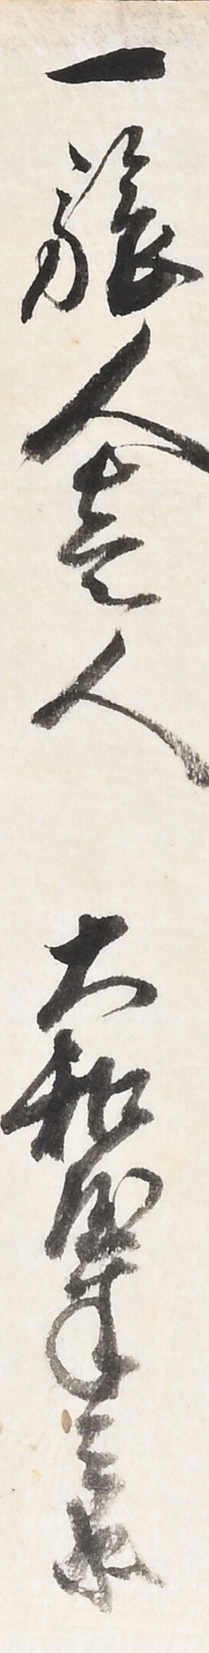一旅人壱人大和屋半兵衛
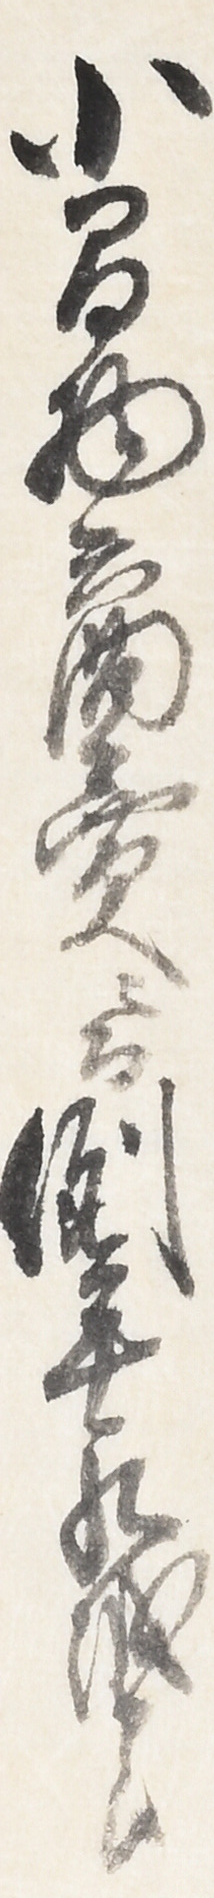小間物商売ニ而例年罷越申候
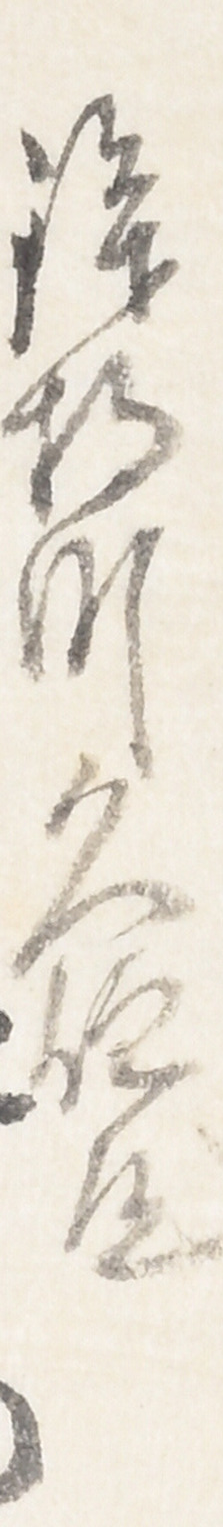鉾持町久住屋
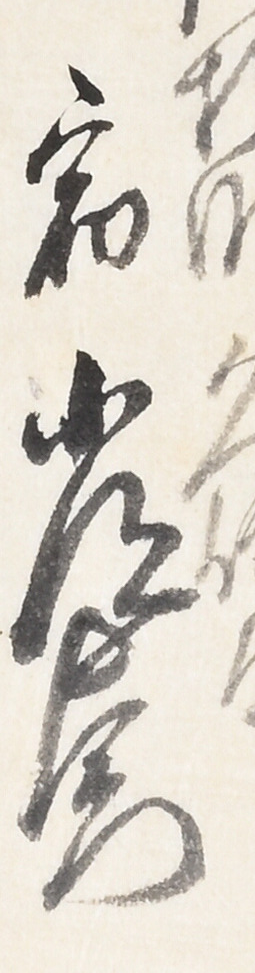宿常右衛門
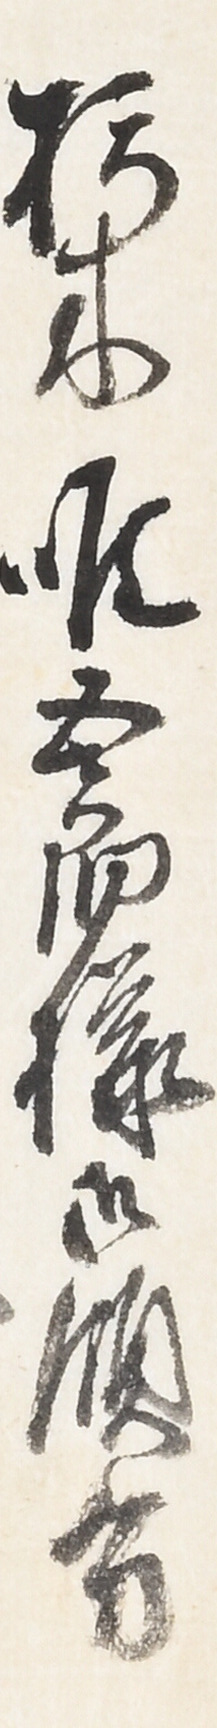朽木唯五郎様御領分
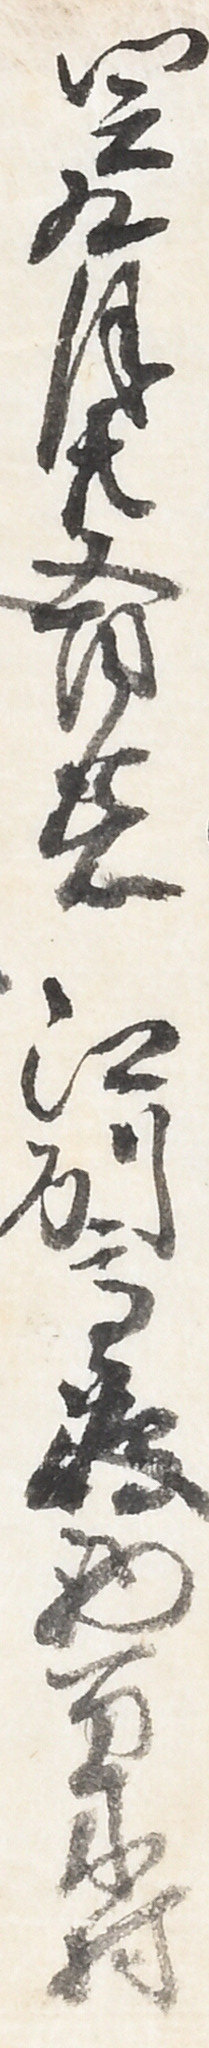閏九月廿五日着江州高嶋西万木村
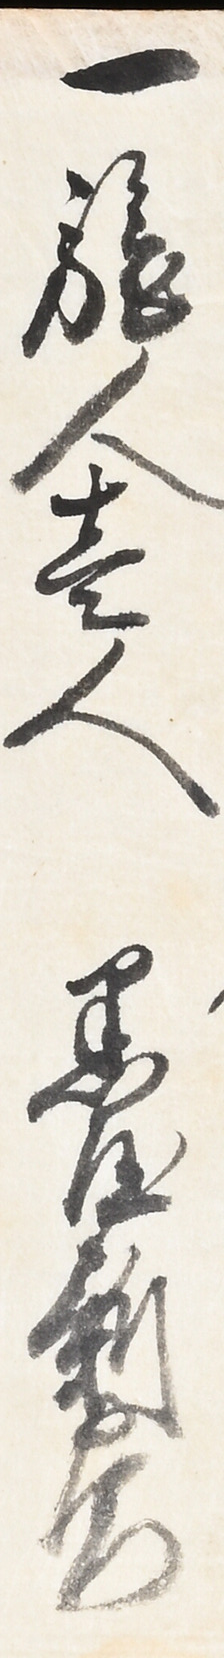一旅人壱人黒屋新右衛門
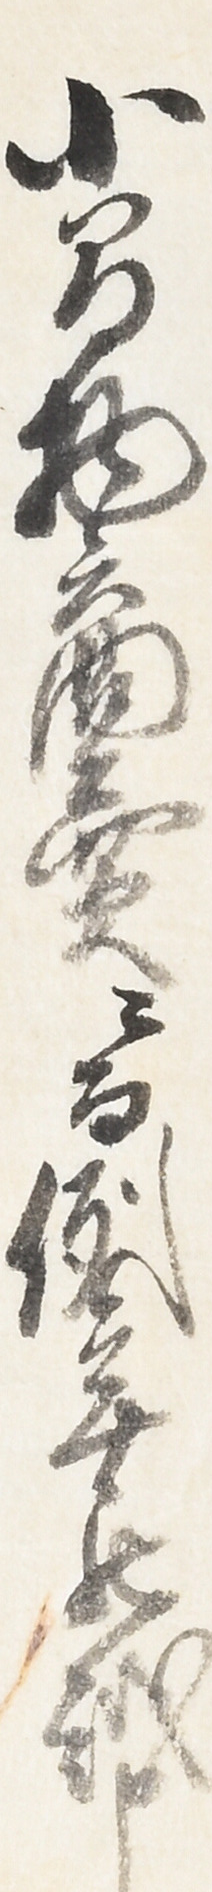小間物商売ニ而例年罷越申候
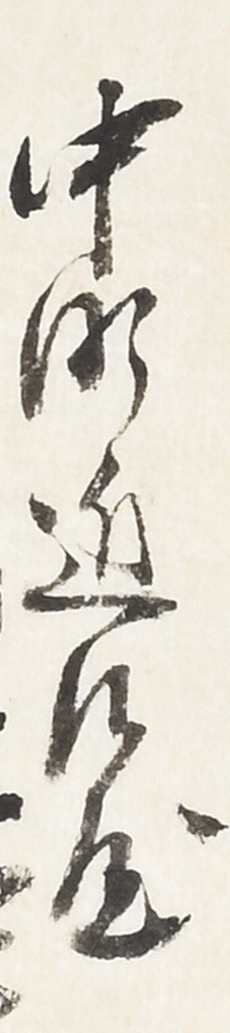中町近江屋
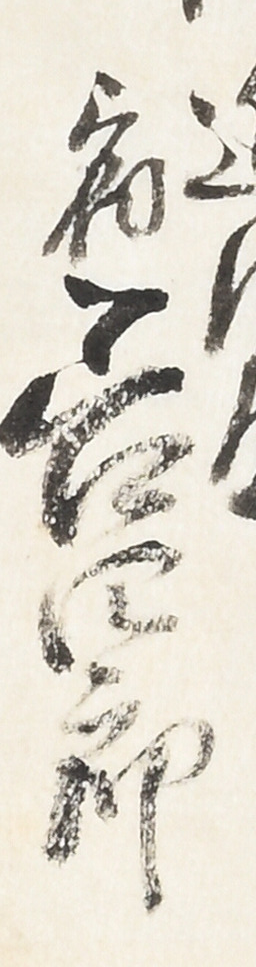宿善四郎
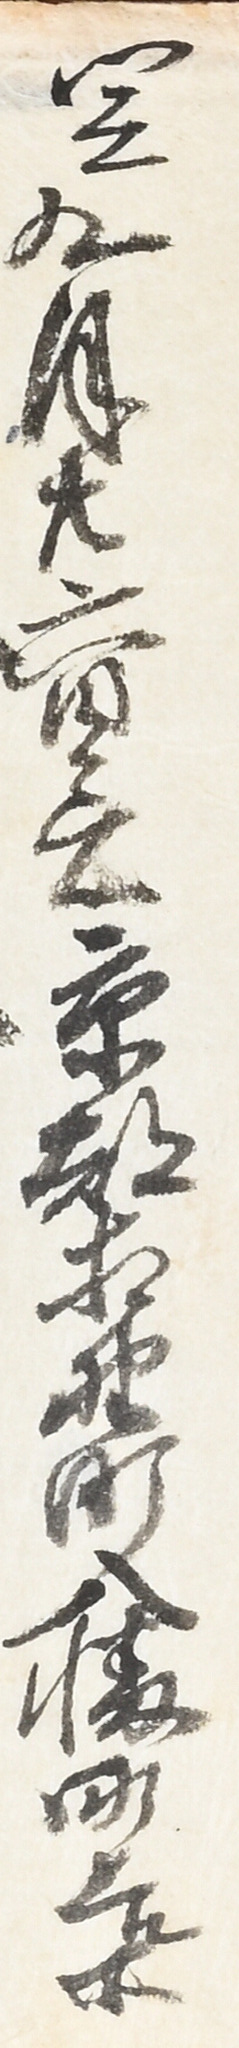閏九月廿六日着京都相野町八幡町上ル所
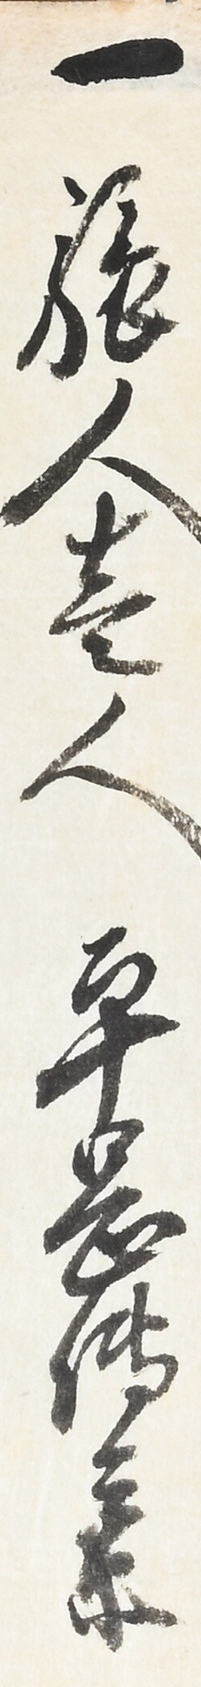一旅人壱人平岡伝兵衛
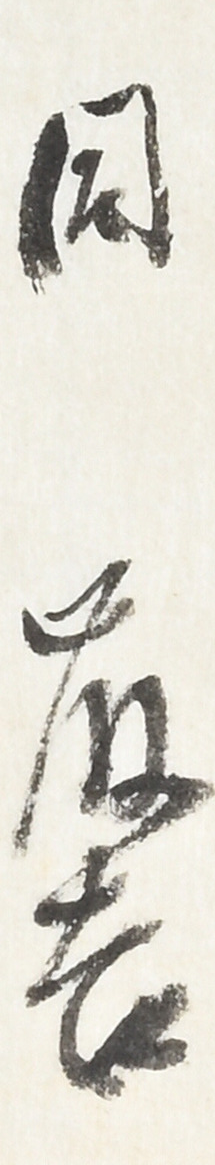同藤吉
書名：旅人泊控帳
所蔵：伊那市立高遠町図書館・合同会社AMANE
